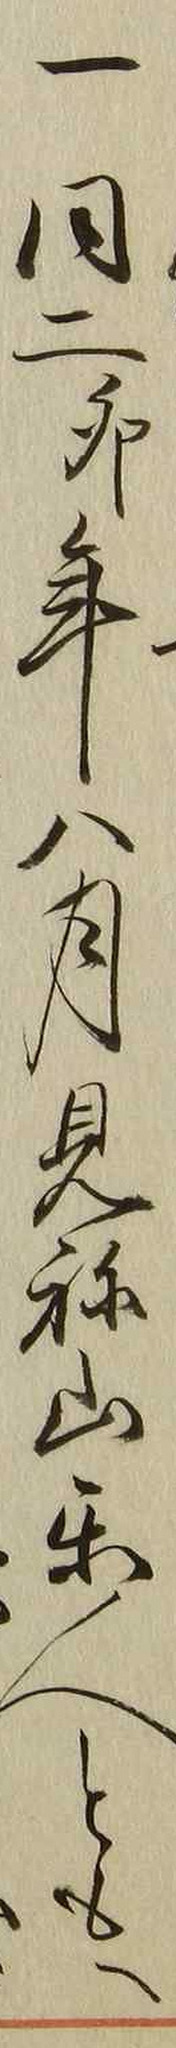一同二卯年八月見祢山楽人ともへ
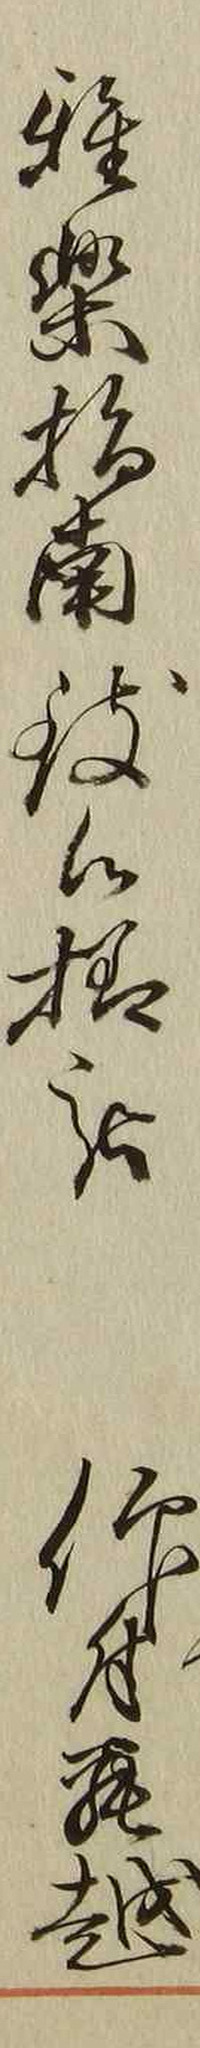雅楽指南致候様被仰付罷越
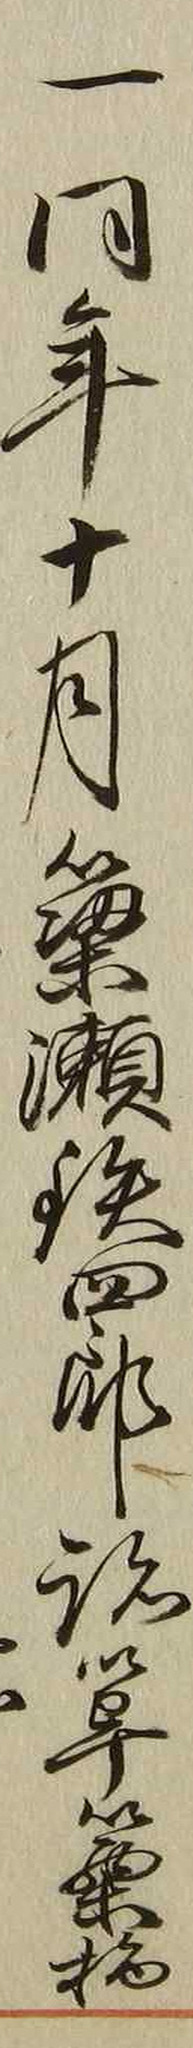一同年十月簗瀬鉄四郎跡篳篥指
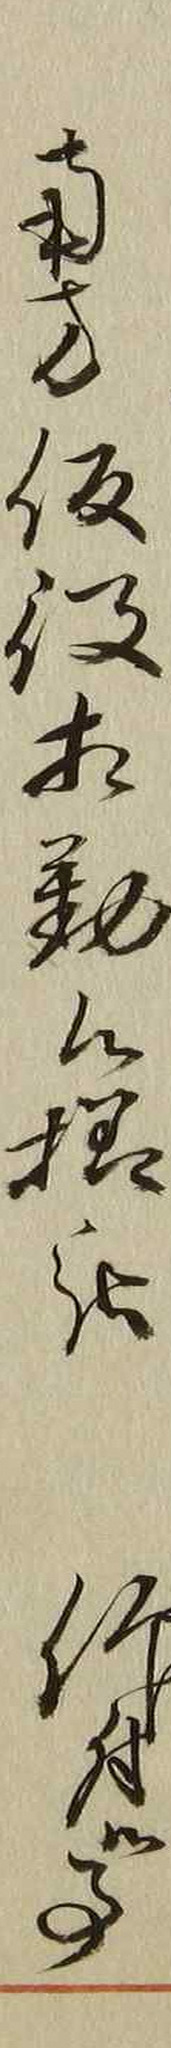南方仮役相勤候様被仰付候事
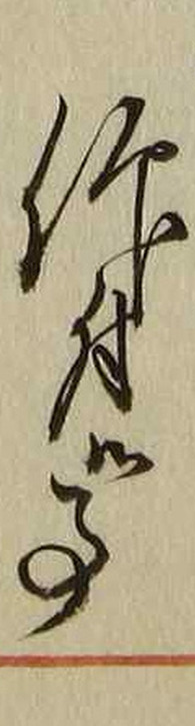仰付候事
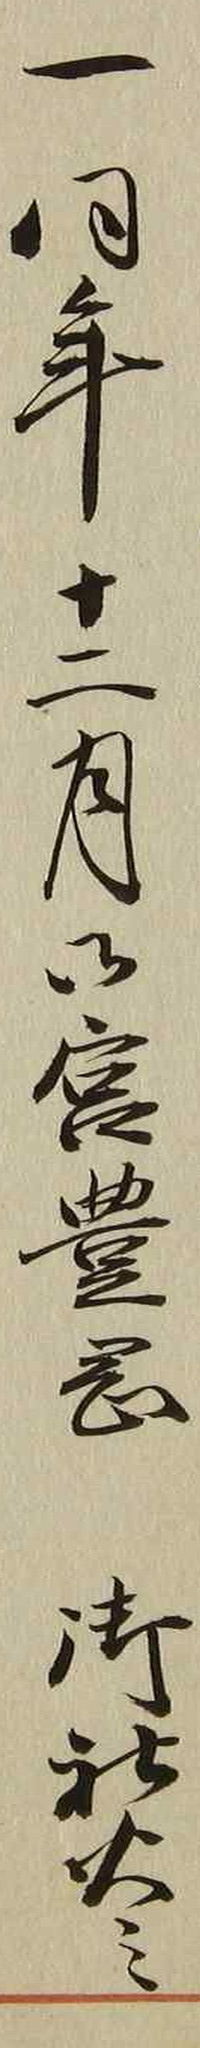一同年十二月御宮豊岡御社火之
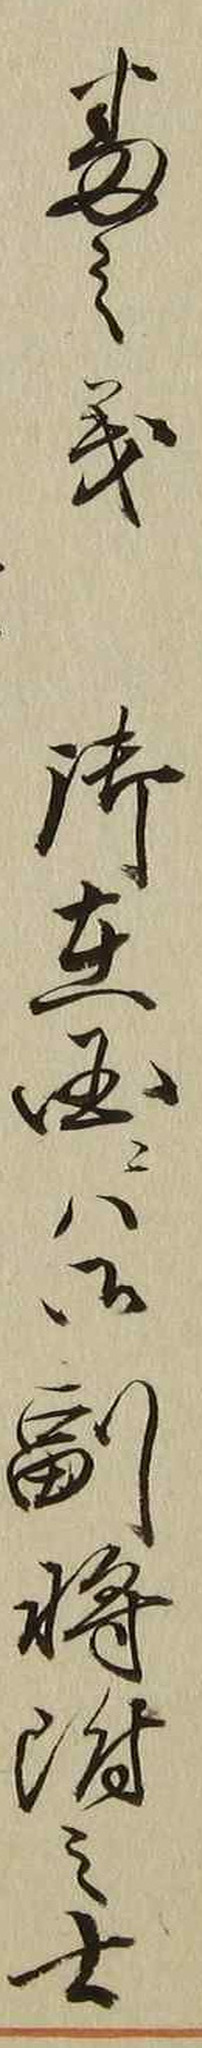番之義御在国ニハ御副将附之士
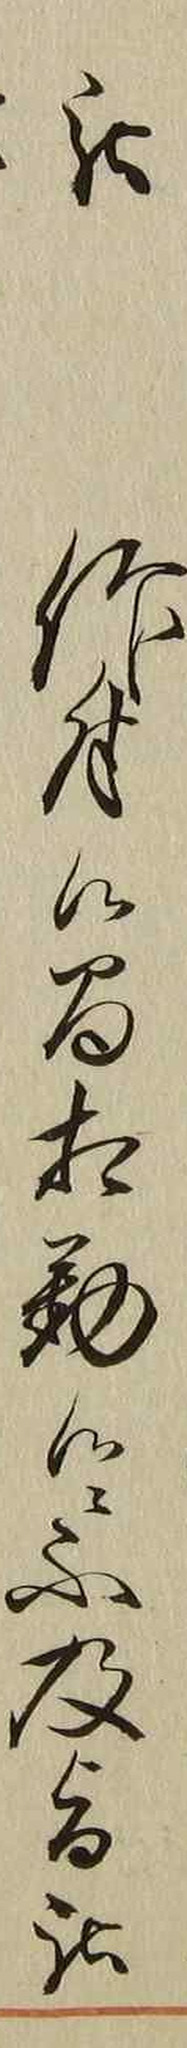被仰付候間相勤候ニ不及旨被
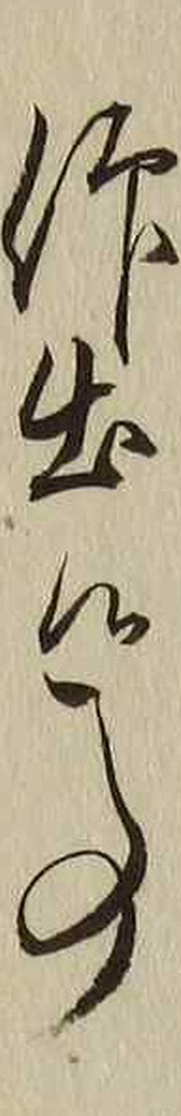仰出候事
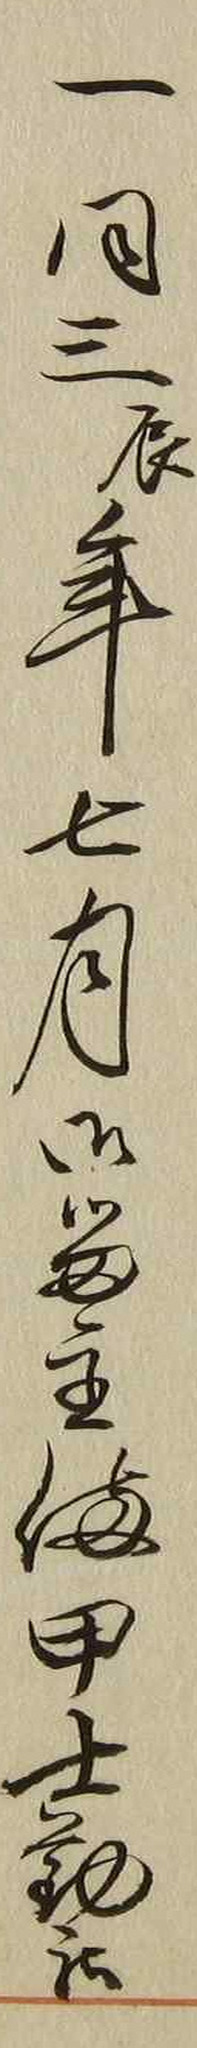一同三辰年七月御留主備甲士勤被
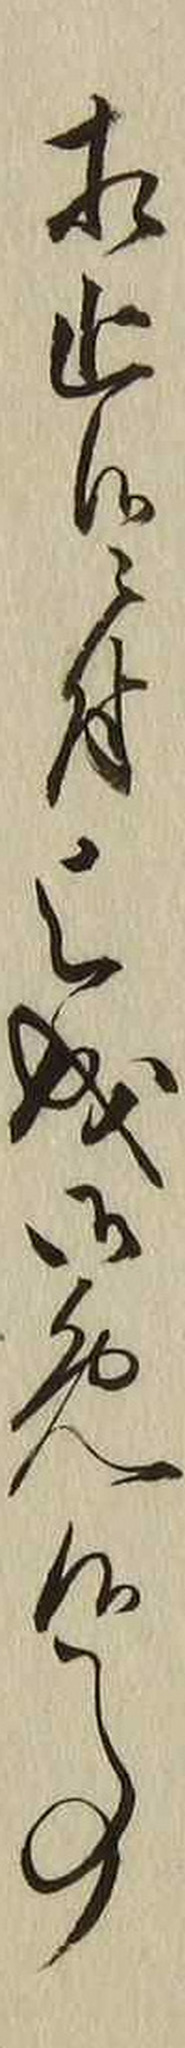相止候ニ付被成御免候事
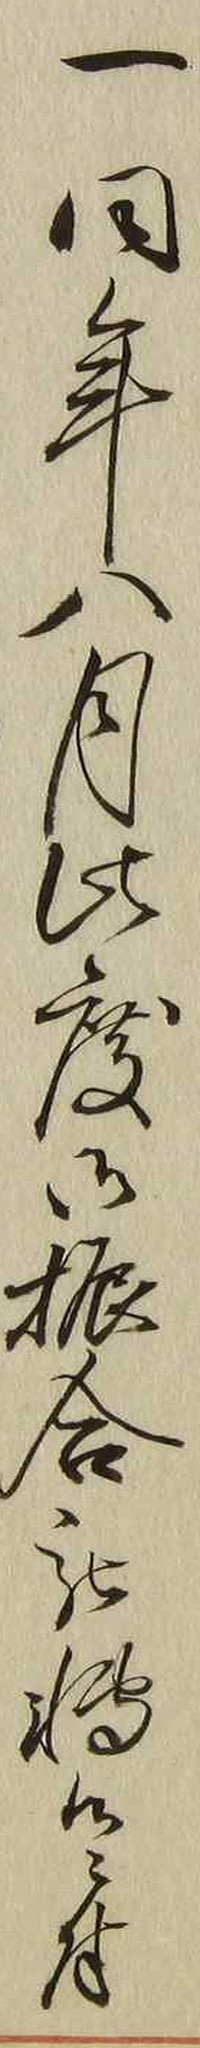一同年八月此度御振合被転候ニ付
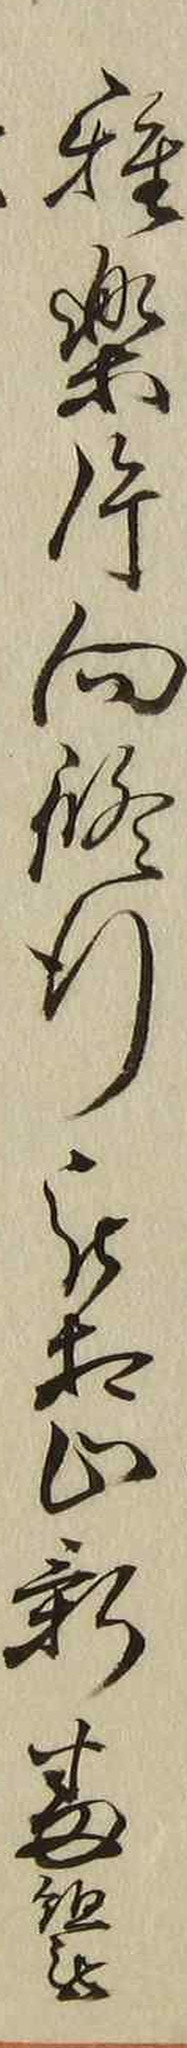雅楽片向修行被相止新番組被
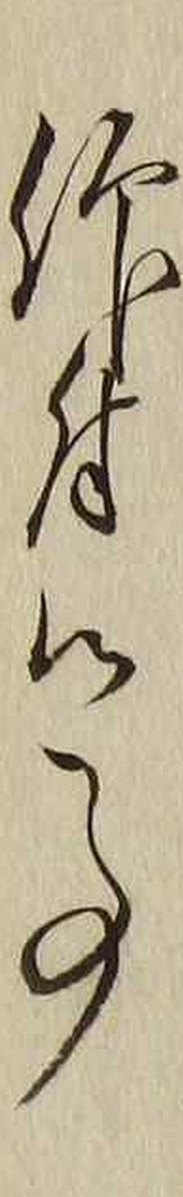仰付候事
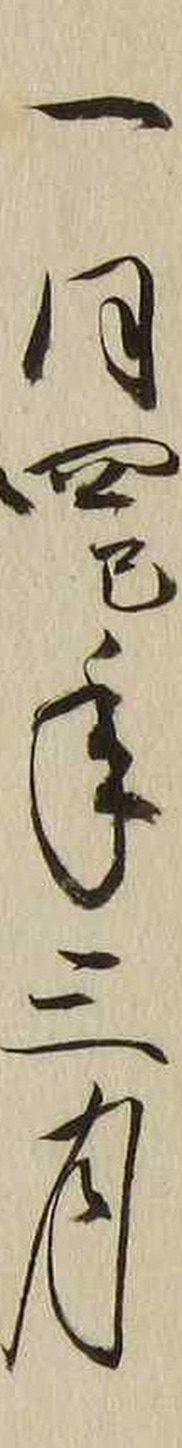一同四巳年三月
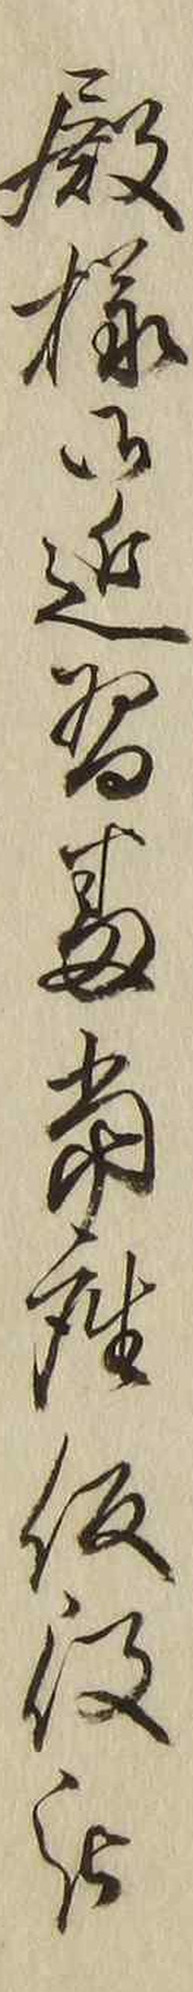殿様御近習番当座仮役被
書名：諸士系譜　巻之57　ほ之部4
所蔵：会津若松市立会津図書館
